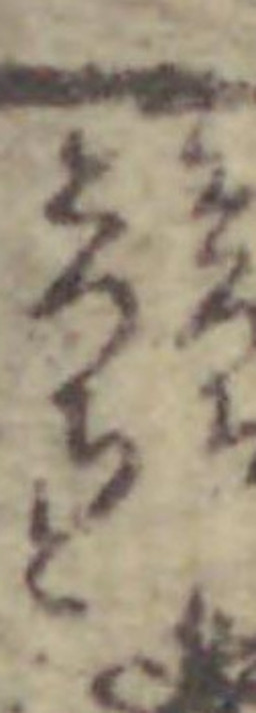こつちと
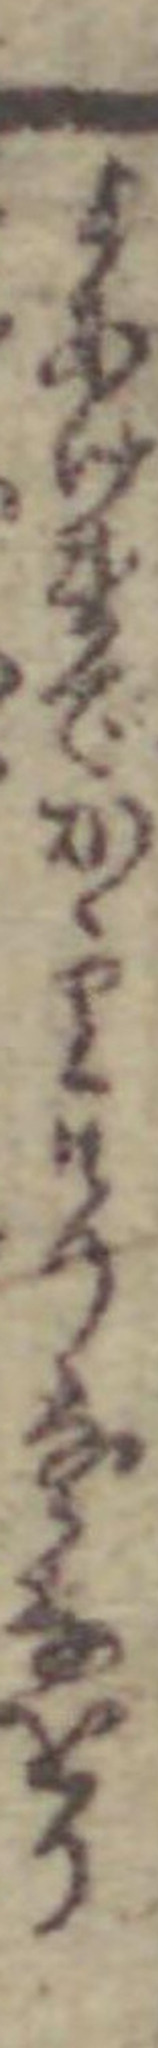よあけまでかゝりけりなかなをり
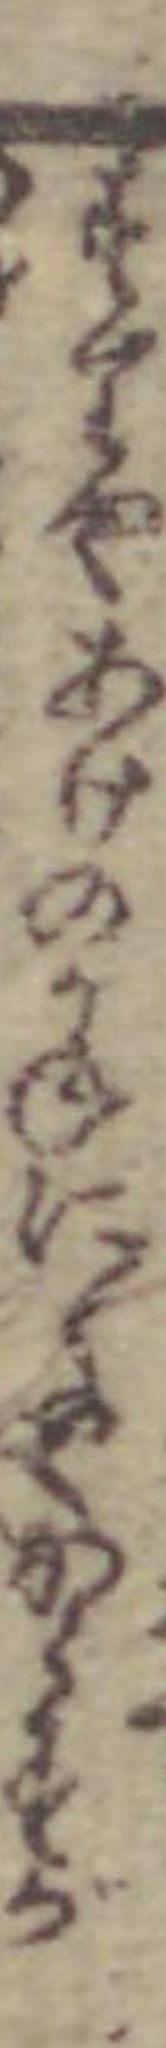すりやあけのかねにくやからすが
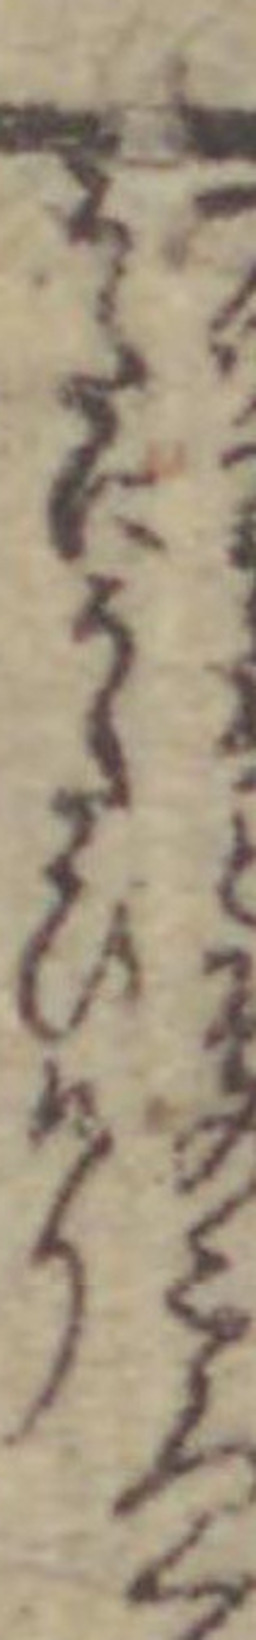うたにうたひけり
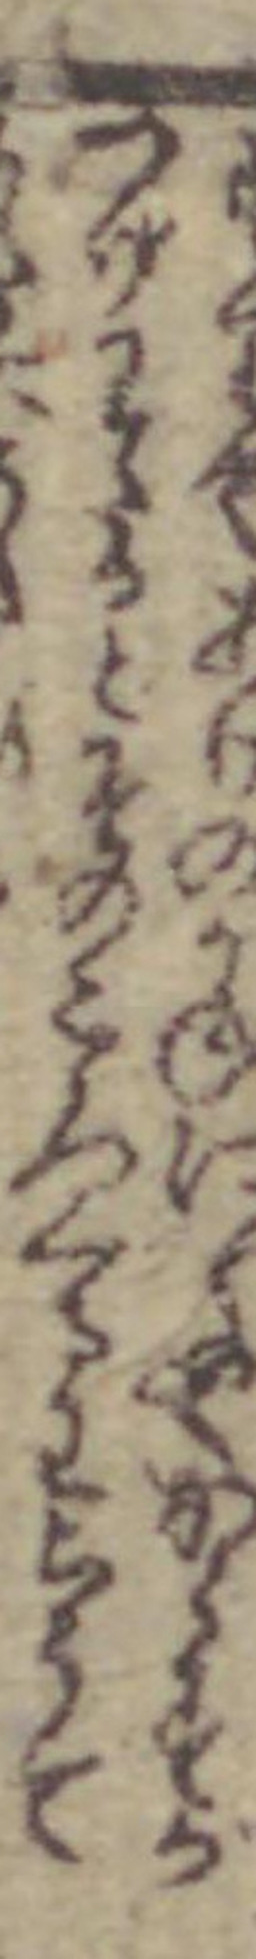つけわたるとそのころくるわちうて
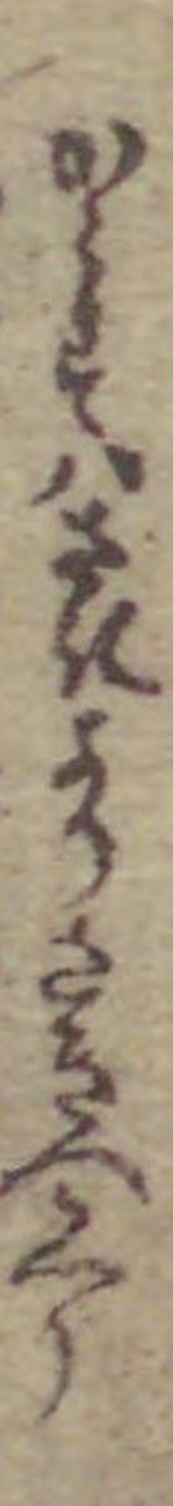からすハさきよりさきへかへり
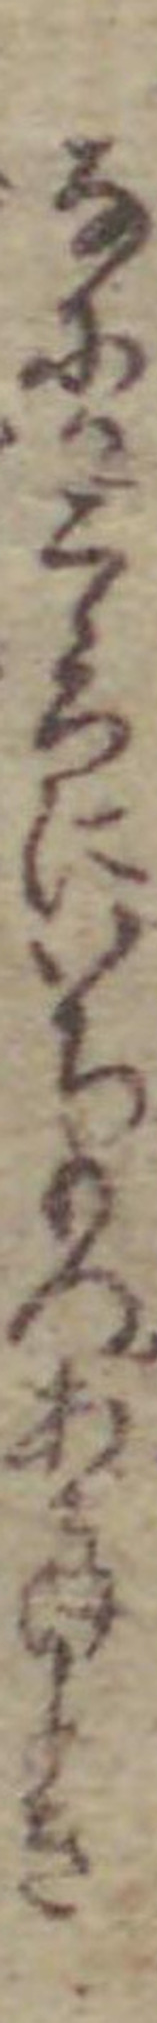なにかこゝろにいちもつあるけしき
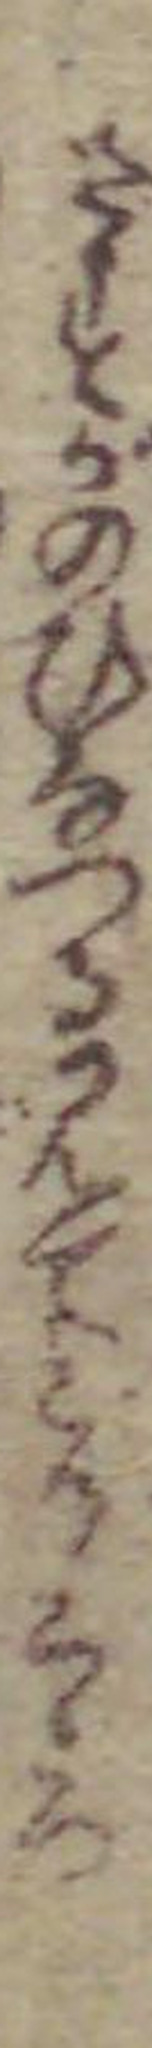さすがのひなつる見てとりこゝろ
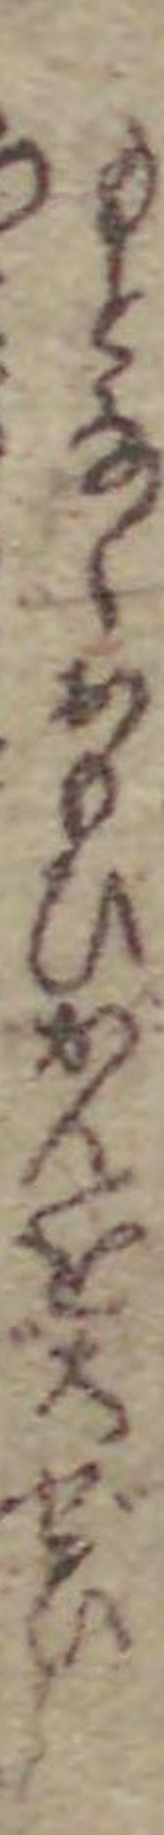もとなくおもひがんを大ぜい
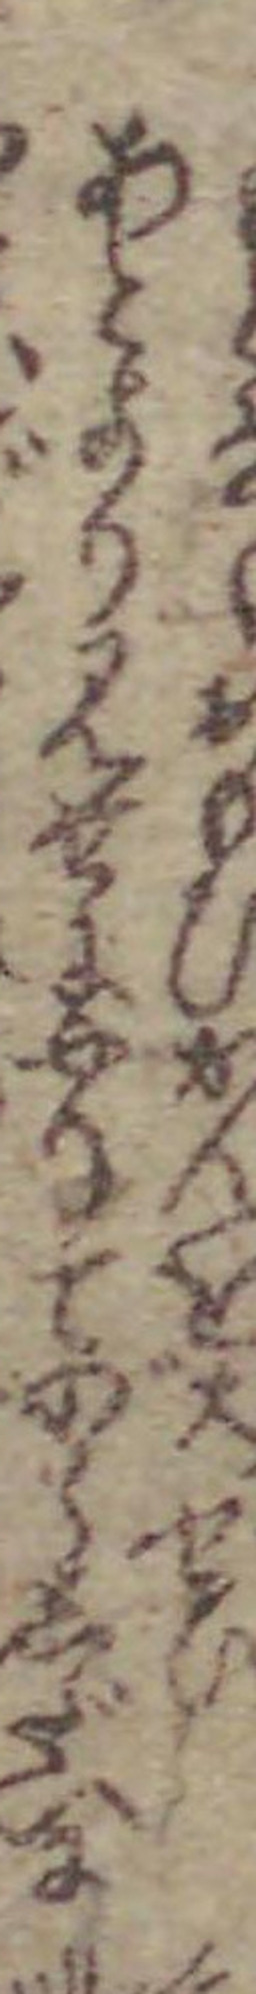あとより見せにやりてがらしだいに
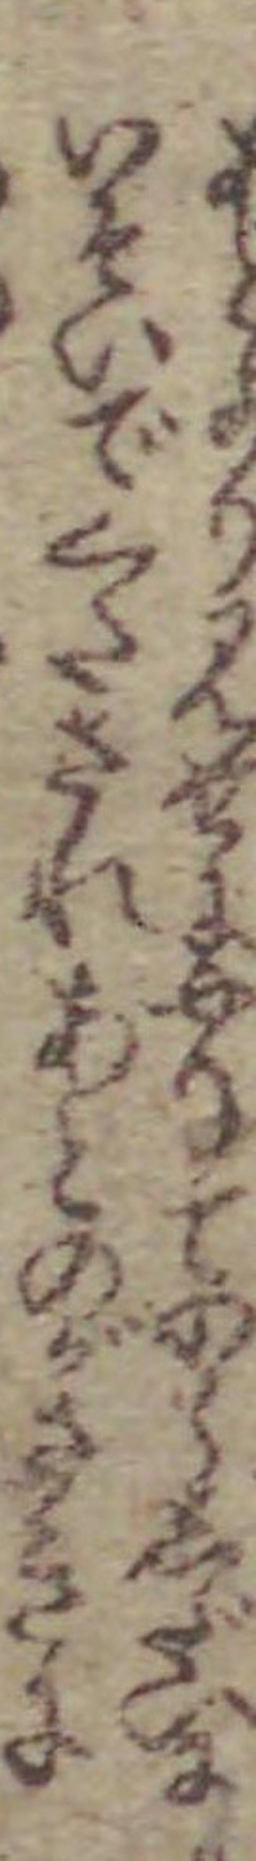いそいでくたされあとのがさきに
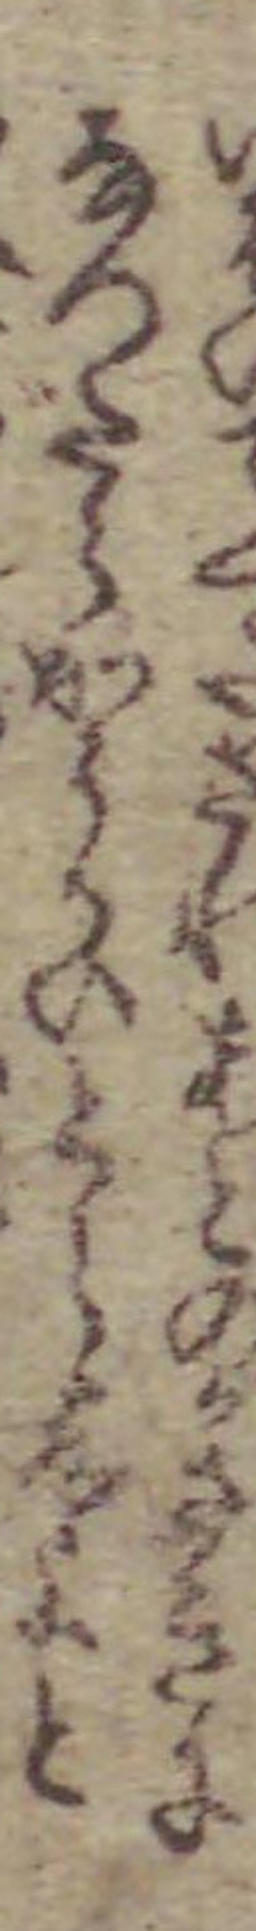なつたらかうかいとらしよと
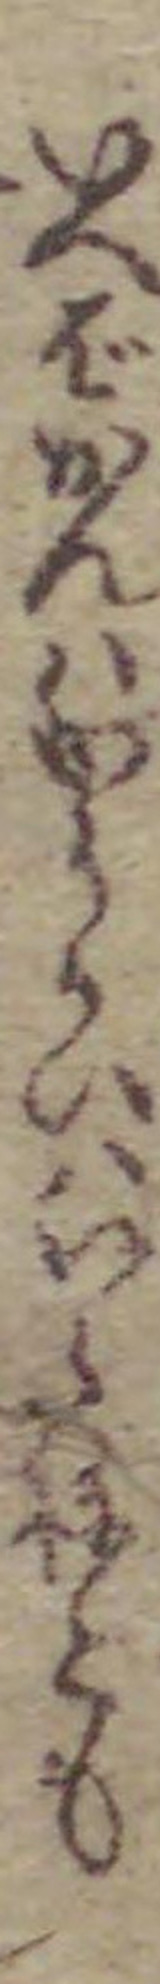いへばがんハかうかいはいらねとも
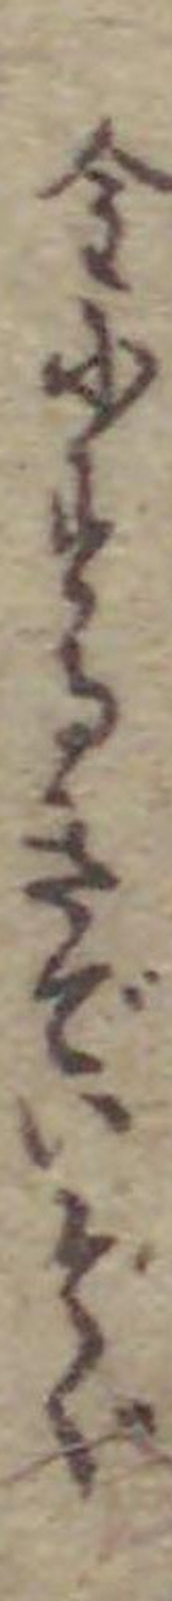金にするきでいそぐ

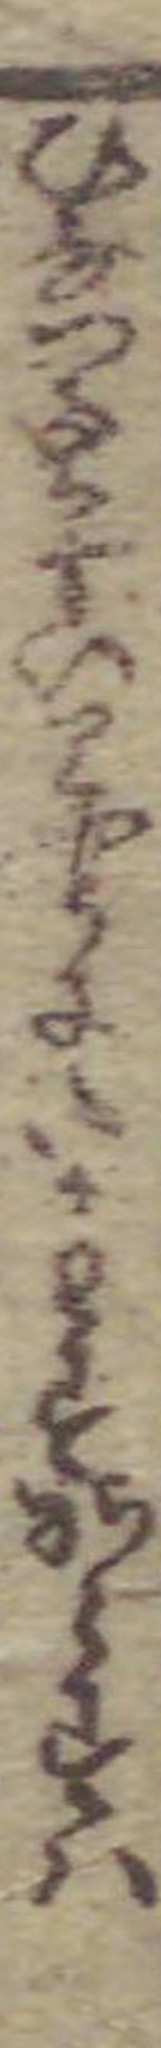ひなつるかすいりやうにたかわすからすハ
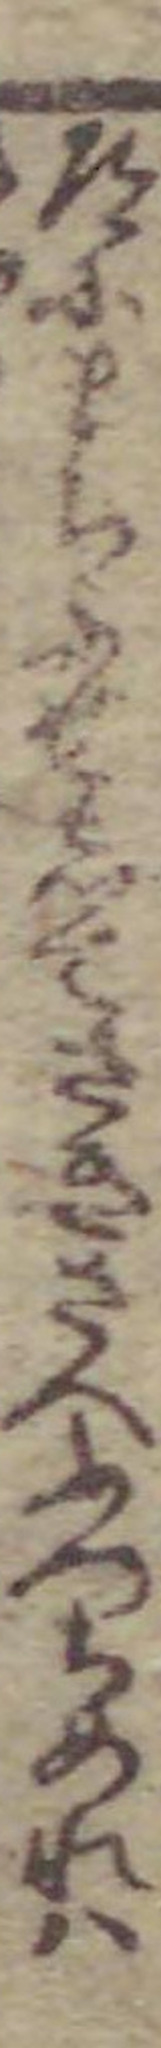道にまちふせしてさきさへふつちめれハ
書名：烏行水諺草 3巻
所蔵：国立国会図書館 National Diet Library, JAPAN
